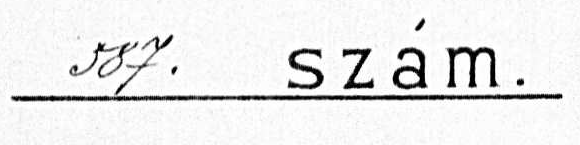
587 szám
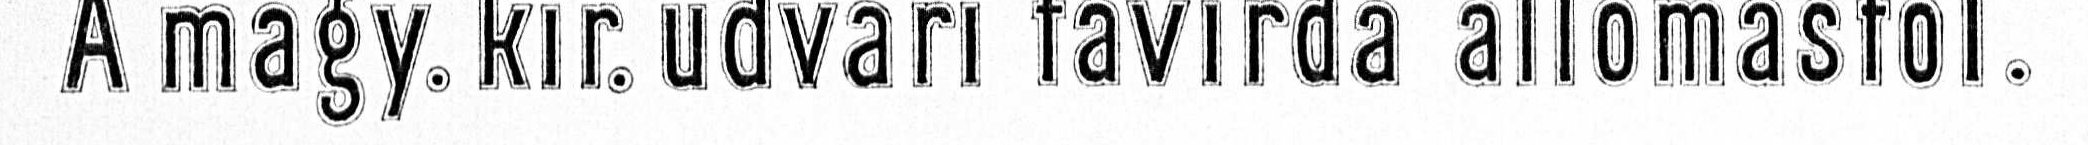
A magy. kir. udvari távirda állomástól.
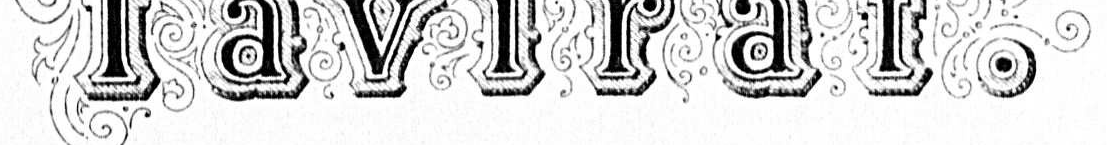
Távirat.
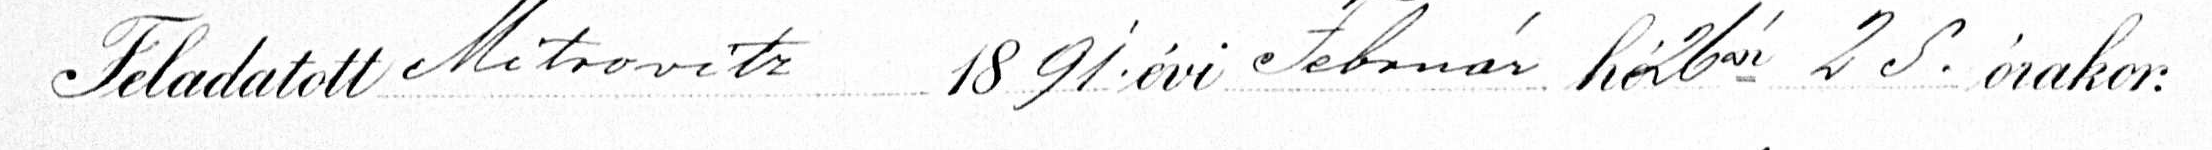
Feladatott: Mitrovitz 1891 évi Február hé26n 25 óraker
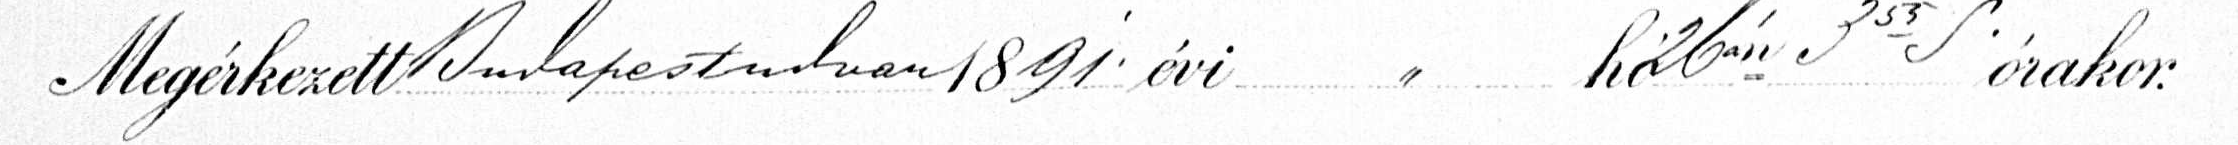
Megérkezett: Budapest ado 1891 évi Február hé 335 óraker
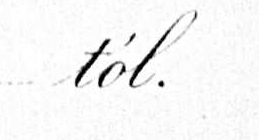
tol.
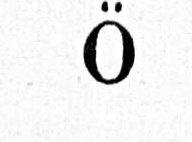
Ö
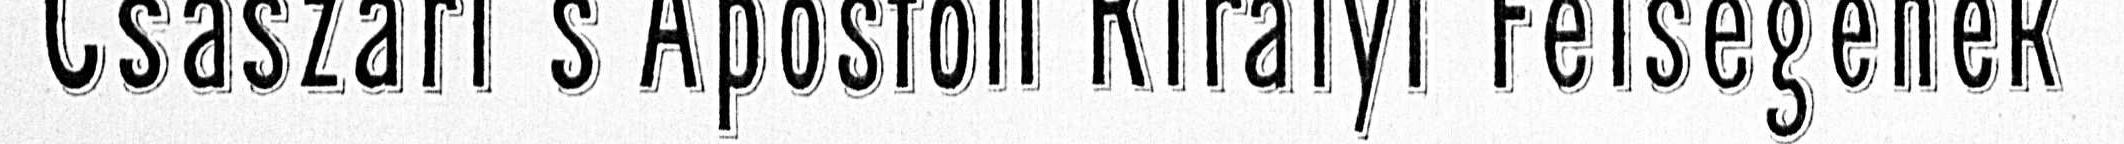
Czászári ś Apostoli Királyi Felségének
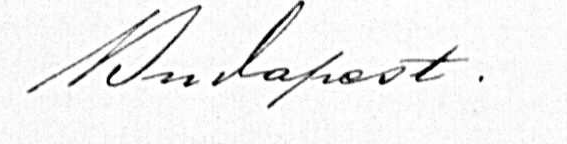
Budapest
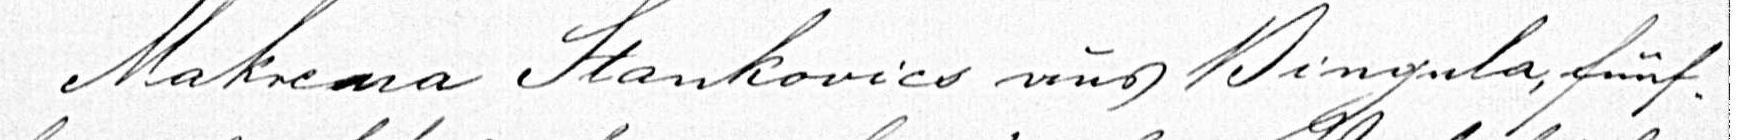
Makrena Stankovics aus Bingula, fünfzig
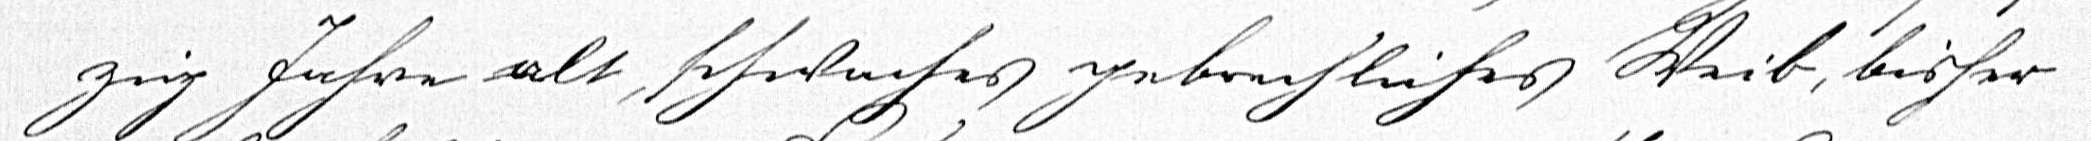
Jahre alt, schwaches gebrechliches Weib, bisher un¬
